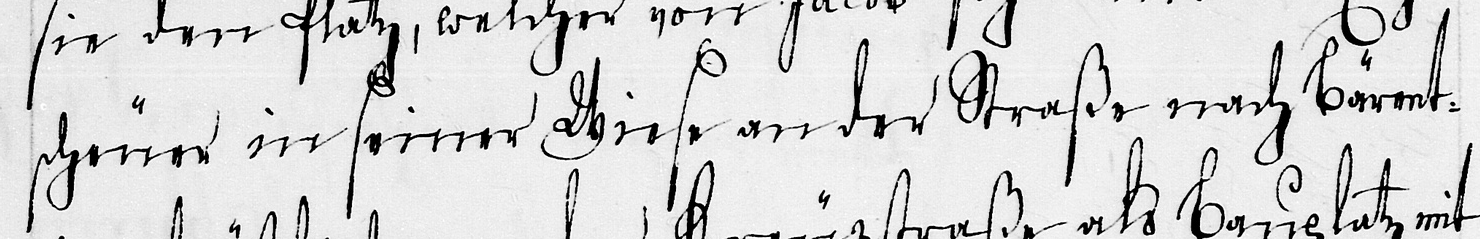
scheuer in seiner Wiese an der Straße nach Bärent¬
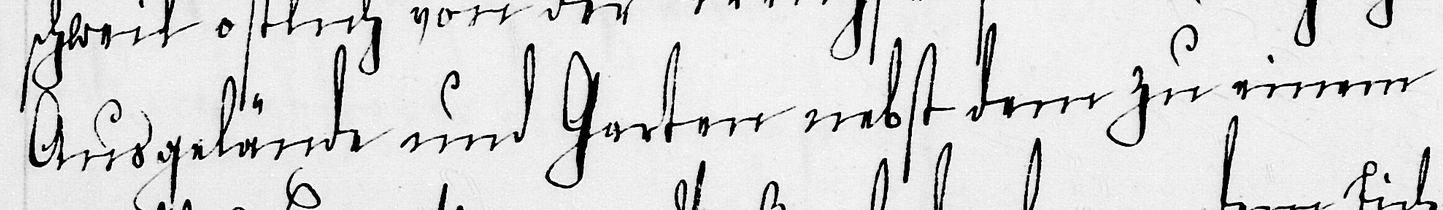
Ausgelände und Garten nebst dem zu einem
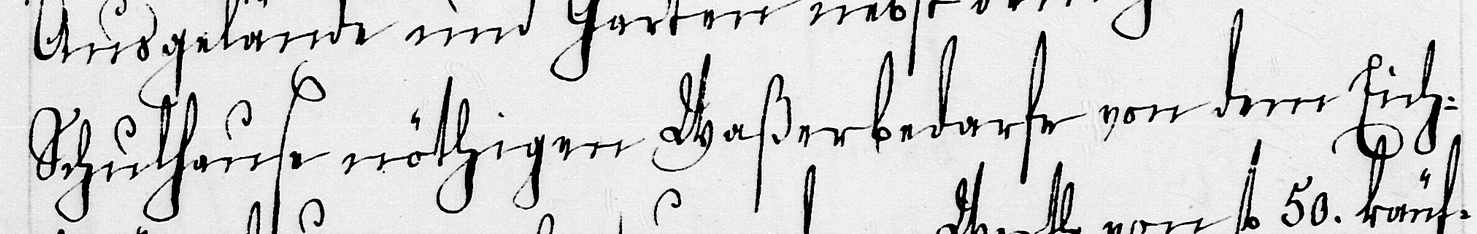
Schulhause nöthigen Waßerbedarfe von dem Eich¬
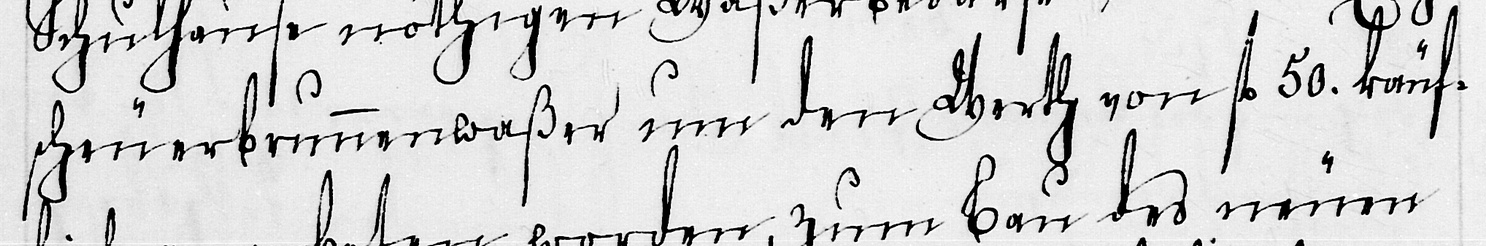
scheuerbrunnenwaßer um den Werth von fl. 50. käuf¬
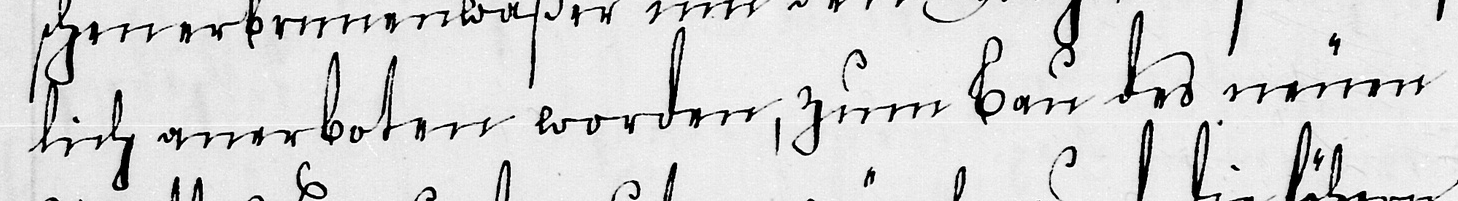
lich anerboten worden, zum Bau des neuen
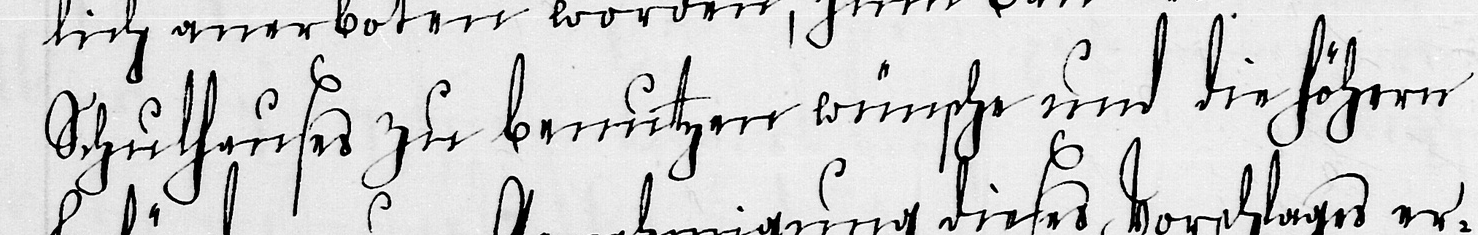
Schulhauses zu benutzen wünsche und die höhern
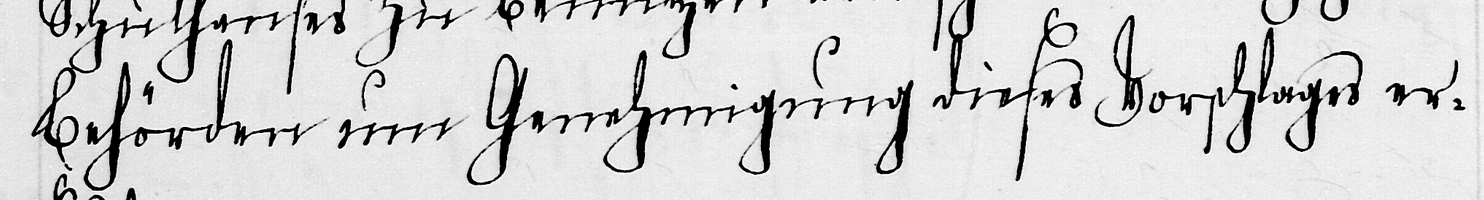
Behörden um Genehmigung dieses Vorschlages er¬
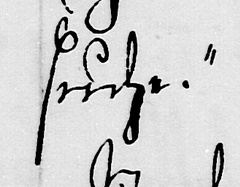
such¬
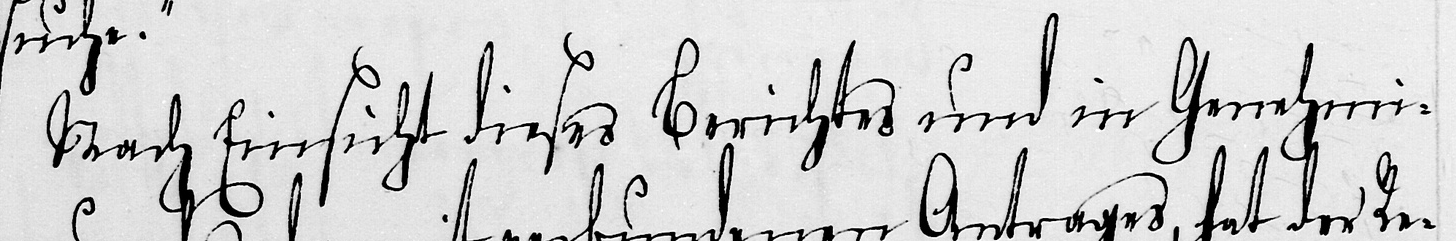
Nach Einsicht dieses Berichtes und in Genehmi¬
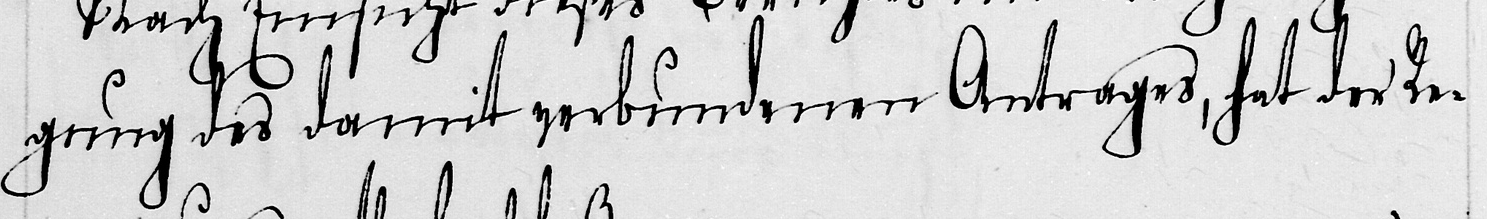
gung des damit verbundenen Antrages, hat der Re¬
